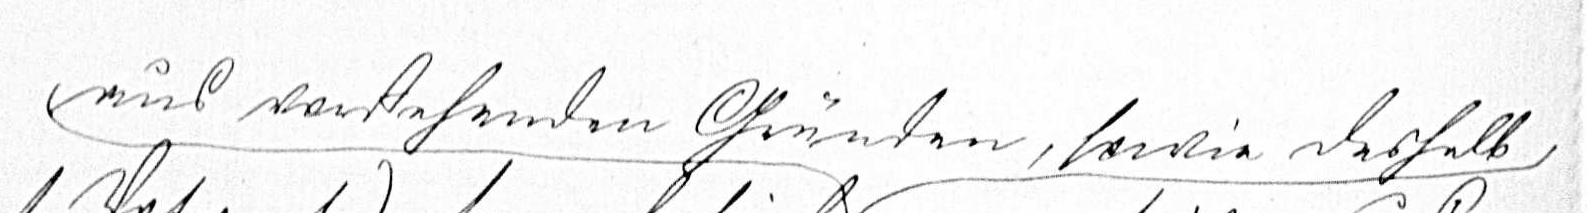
aus vorstehenden Gründen, sowie deshalb
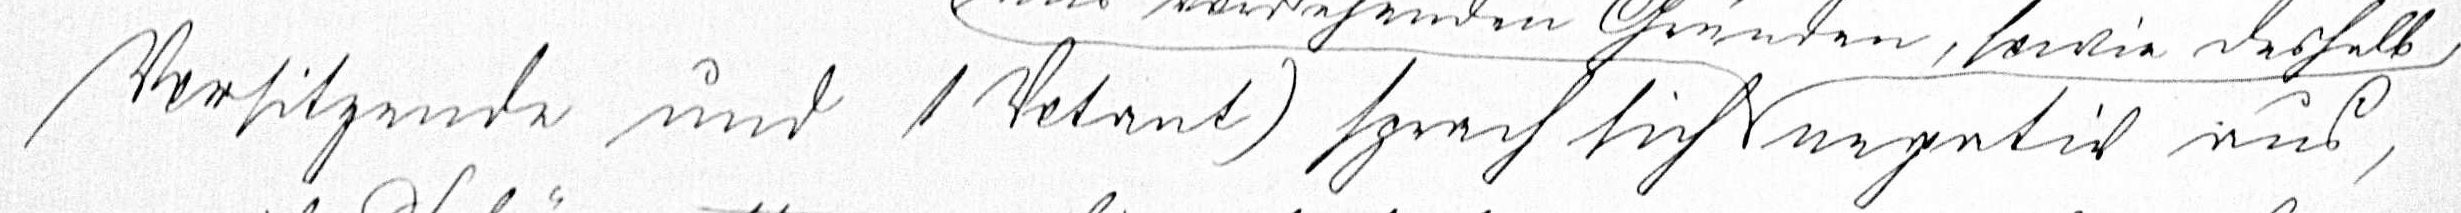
Vorsitzende und 1 Votant) sprach sich negativ aus,
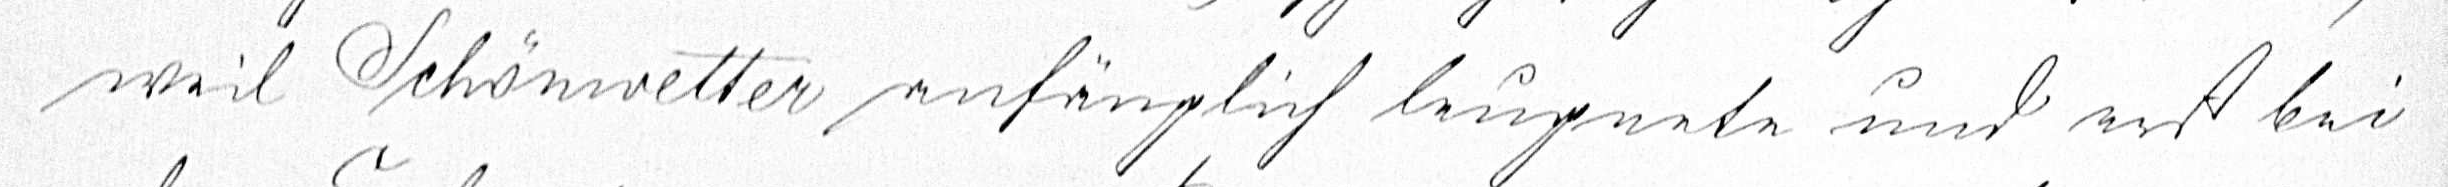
weil Schönwetter anfänglich leugnete und erst bei
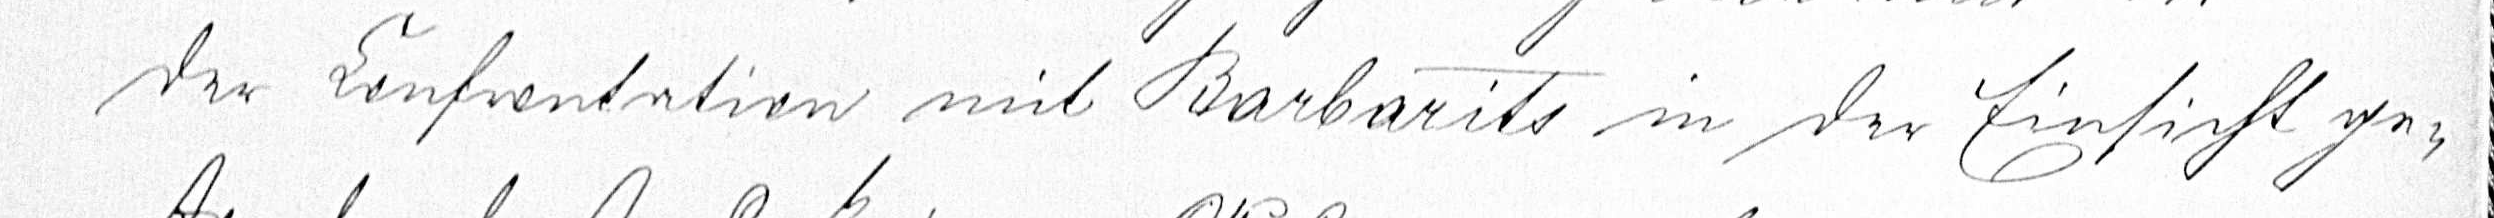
der Confrontation mit Barbarits in der Einsicht ge¬
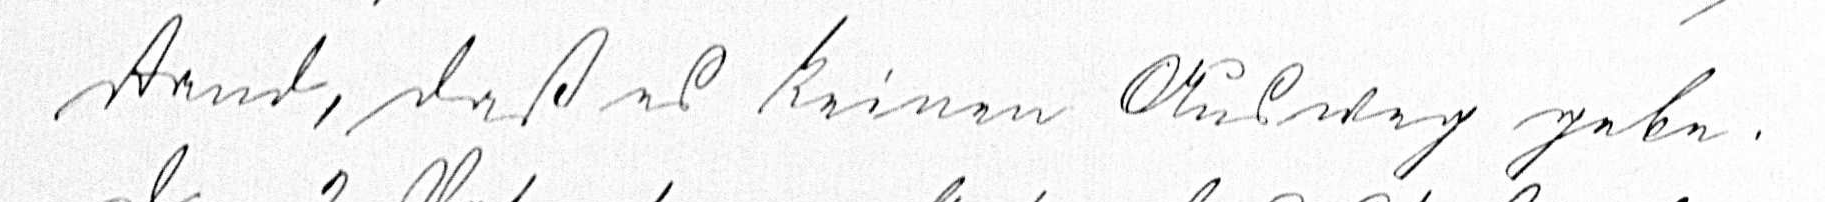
stand, daß es keinen Ausweg gebe.
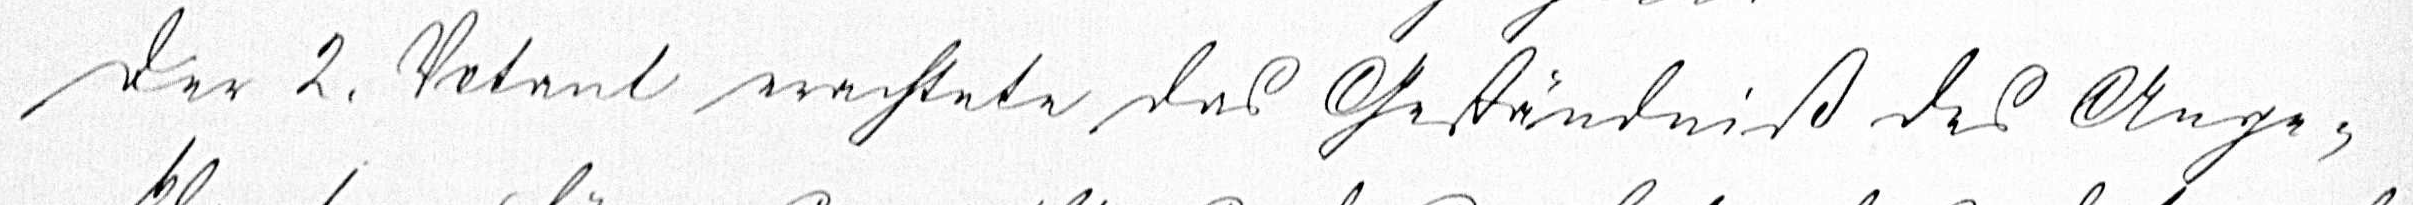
Der 2. Votant erachtete das Geständniß des Ange¬
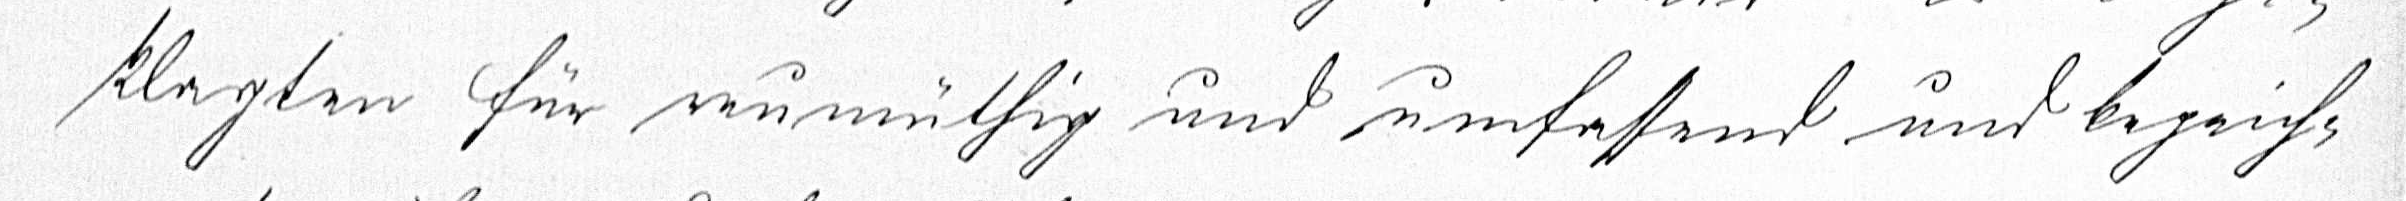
klagten für reumüthig und umfassend und bezeich¬
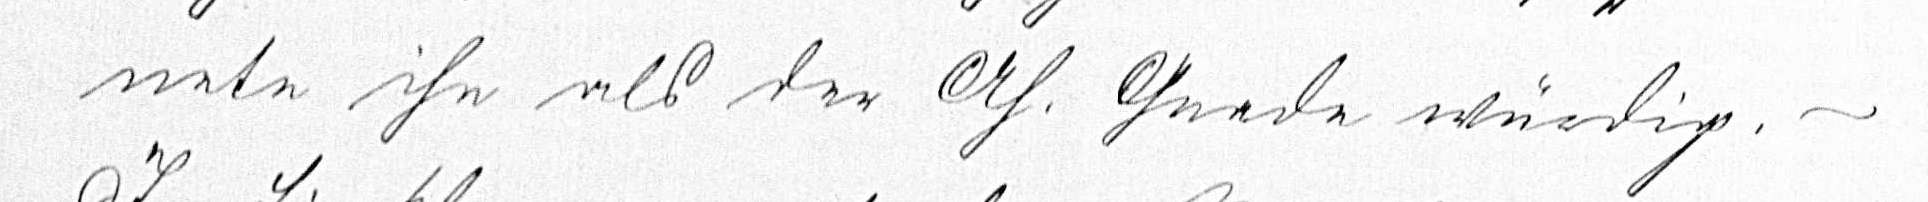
nete ihn als der Ah. Gnade würdig.
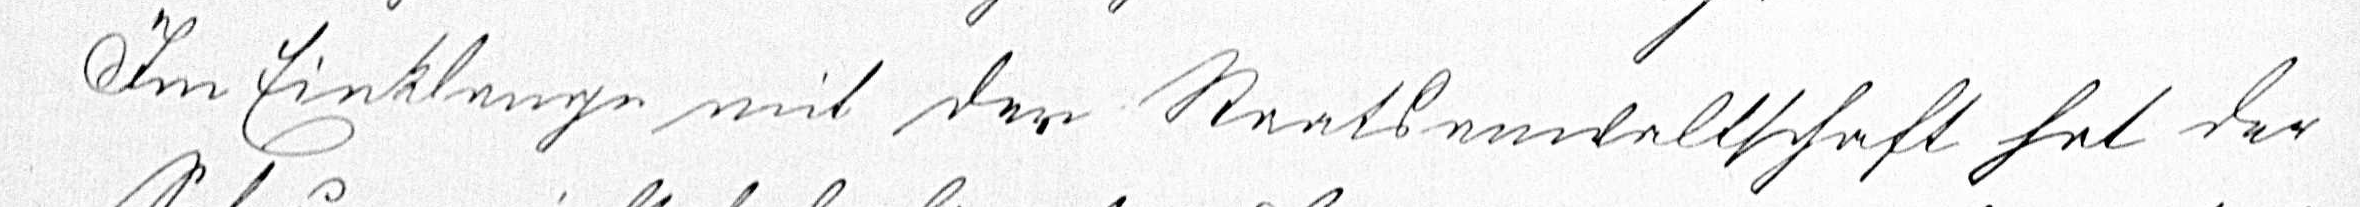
Im Einklange mit der Staatsanwaltschaft hat der
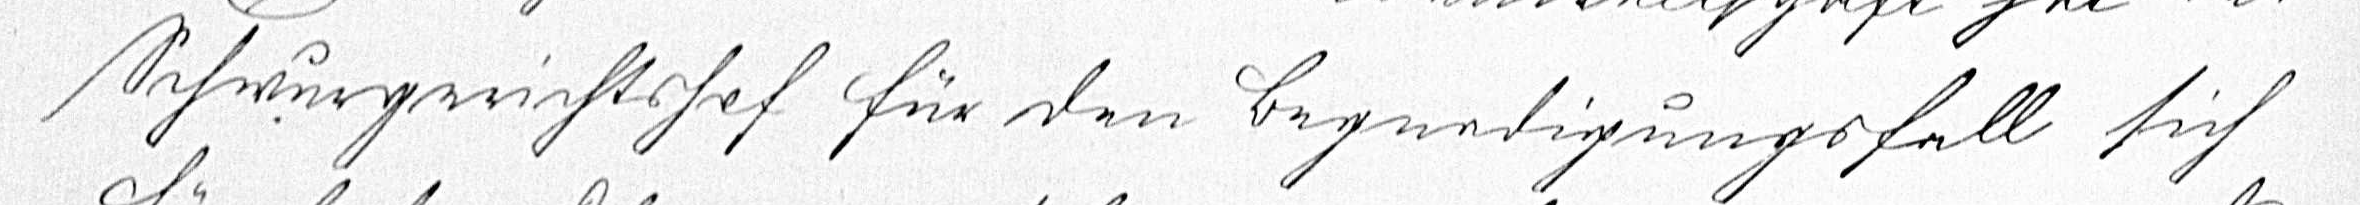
Schwurgerichtshof für den Begnadigungsfall sich
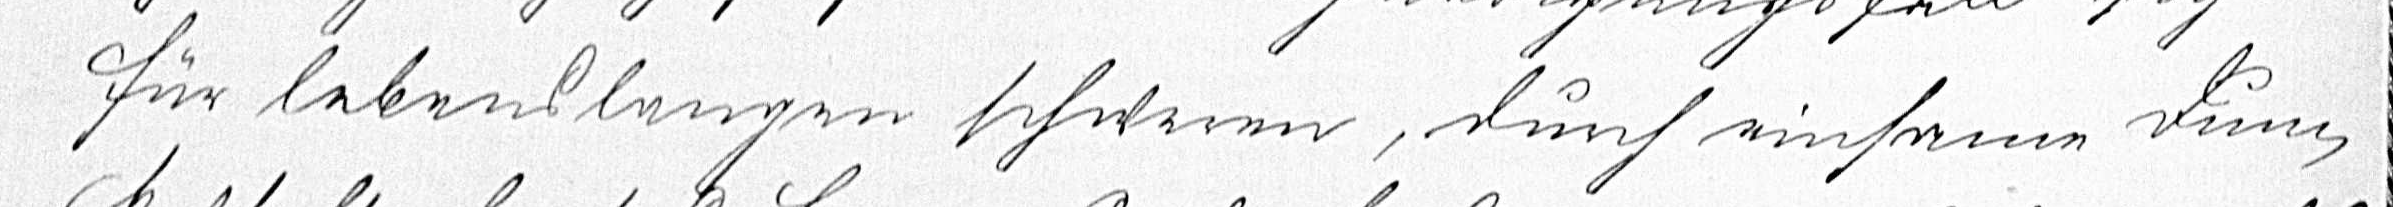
für lebenslangen schweren, durch einsame Dun¬
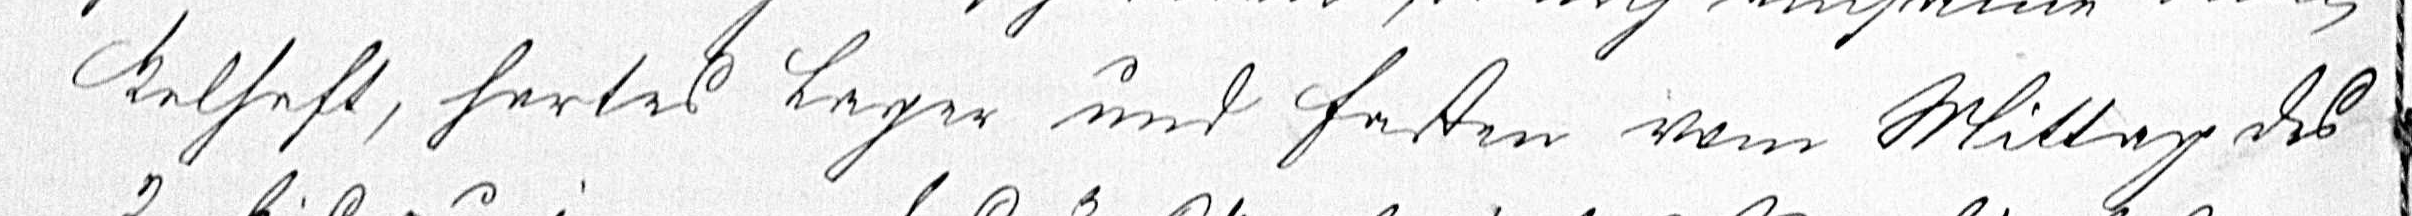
kelhaft, hartes Lager und fasten vom Mittag des
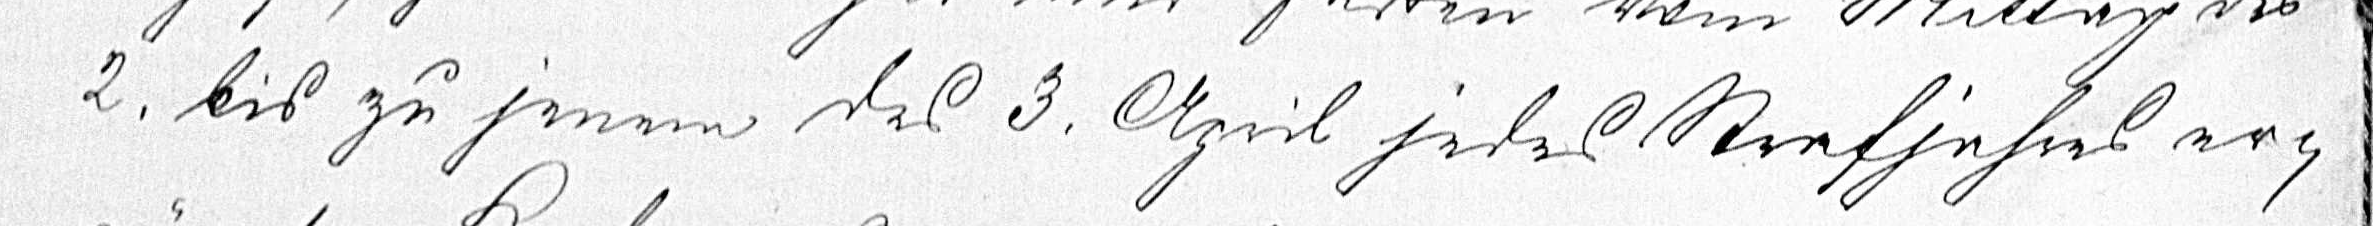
2. Bis zu jenem des 3. April jedes Strafjahres er¬
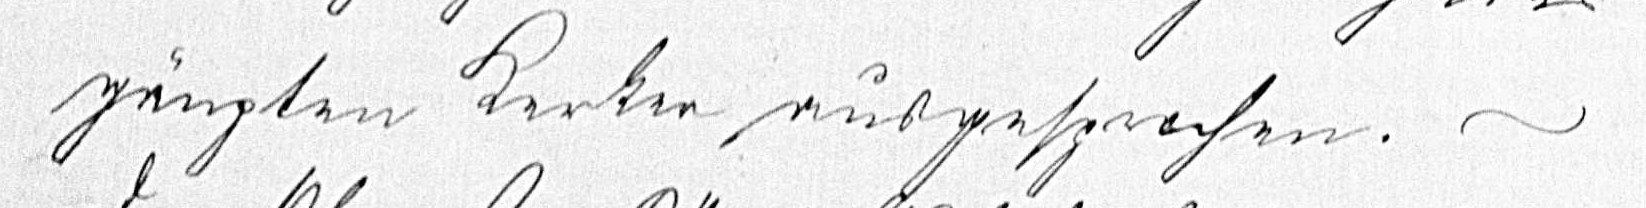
gänzten Kerker ausgesprochen.
